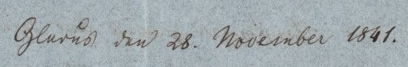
Glarus den 28. November 1841.
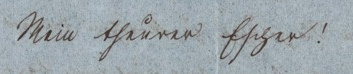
Mein theurer Escher!
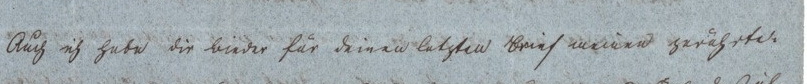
Auch ich habe Dir wieder für Deinen letzten Brief meinen gerührte-
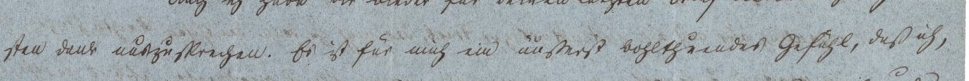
sten Dank auszusprechen. Es ist für mich ein äußerst wohlthuendes Gefühl, daß ich,
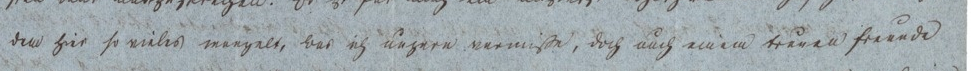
dem hier so vieles mangelt, was ich ungern vermisse, doch auch einem treuen Freunde
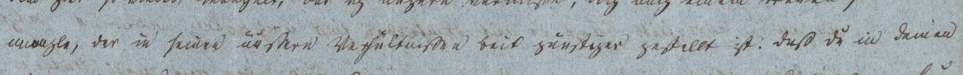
mangle, der in seinen äußern Verhältnissen weit günstiger gestellt ist. Daß Du in Deinen
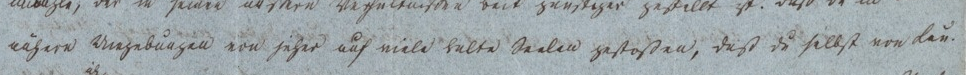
nähern Umgebungen von jeher auf viele kalte Seelen gestoßen, daß Du selbst von Leu-
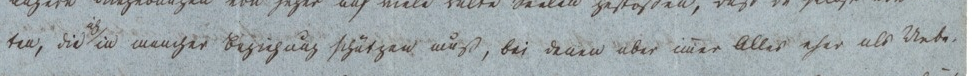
ten, die ich in mancher Beziehung schätzen muß, bei denen aber immer Alles eher als Unbe-
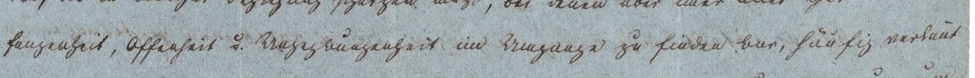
fangenheit, Offenheit u. Ungezwungenheit im Umgange zu finden war, häufig verkannt
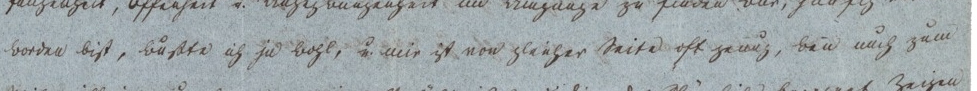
worden bist, wußte ich ja wohl, u. mir ist von gleicher Seite oft genug, wenn auch zum
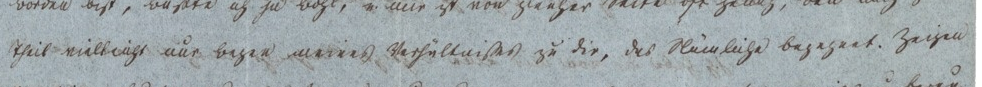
Theil vielleicht nur wegen meines Verhältnisses zu Dir, das Nämliche begegnet. Zeigen
